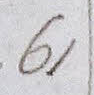61
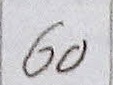60
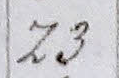23
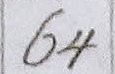64
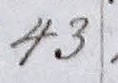43
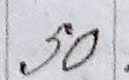50
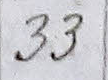33
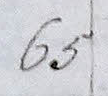65
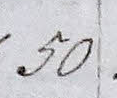50
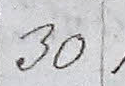30
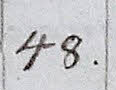48
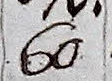60
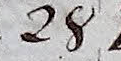28
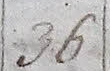36
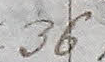36
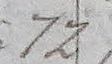72
